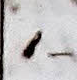1
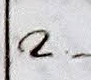2
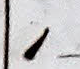1
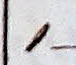1
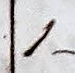1
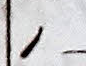1
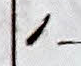1
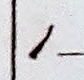1
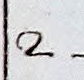2
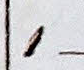1
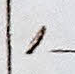1
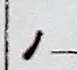1
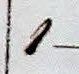1
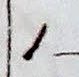1
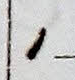1
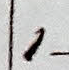1
